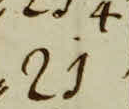21
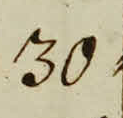30
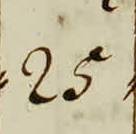25
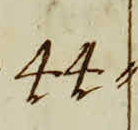44
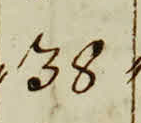38
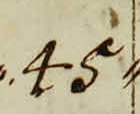45
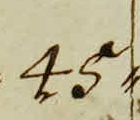45
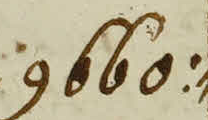9660
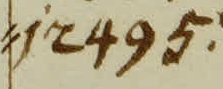12495
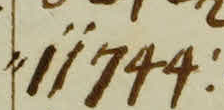11744
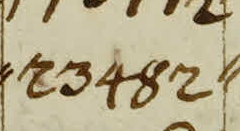23482
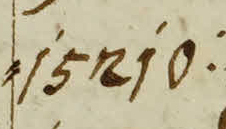15210
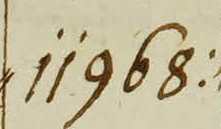11968
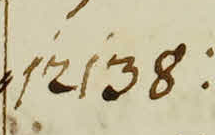12138
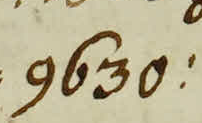9630
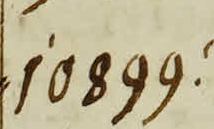10899
